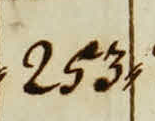253
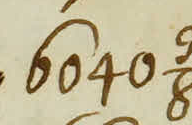6040
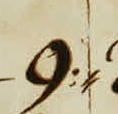9:
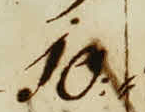10:
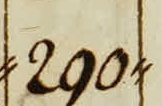290
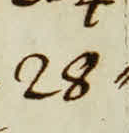28
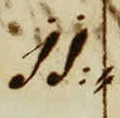11:
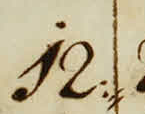12:
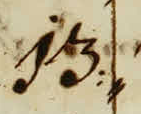13:
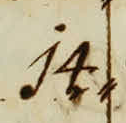14
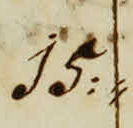15:
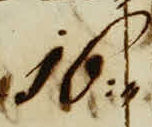16:
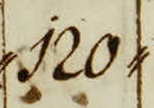120
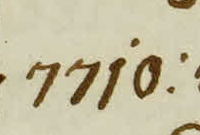7710.
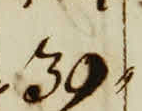39
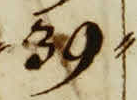39
